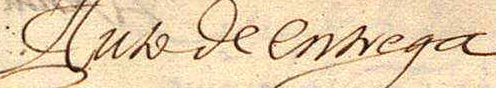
Auto de entrega
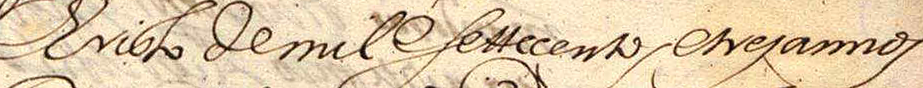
Christo de mil e settecentos e tres annos
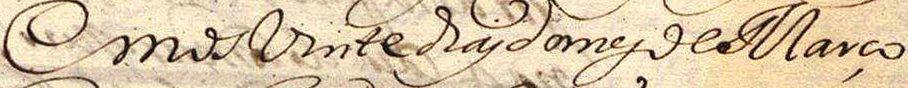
em os Vinte dias do mes de Março
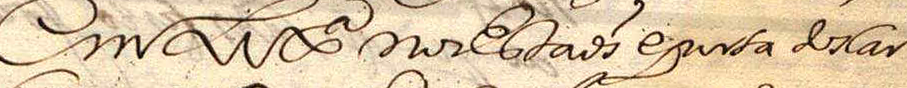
em Lixa nos Estaós e porta dos Car
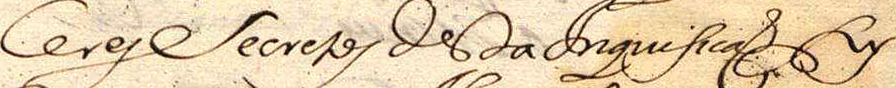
Ceres Secretos desta Inquisicaõ foy
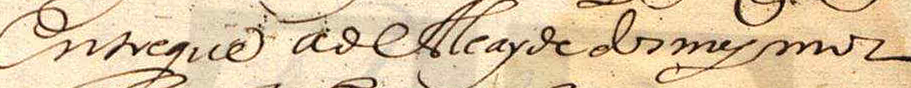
entregue ao Alcayde dos mesmos
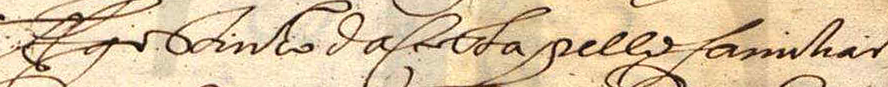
Agostinho da Costa pello familiar
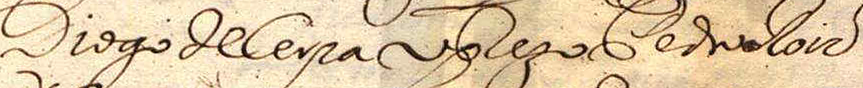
Diogo de Cerpa o prezo Pedro Roiz̄
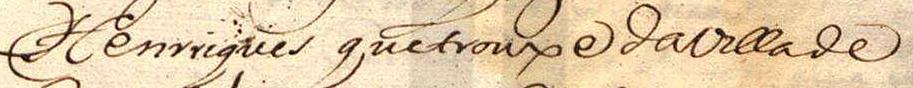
Henrriques que trouxe da villa de
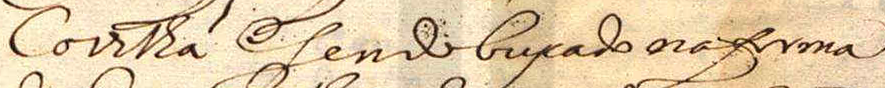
Covilhã e sendo buscado na forma
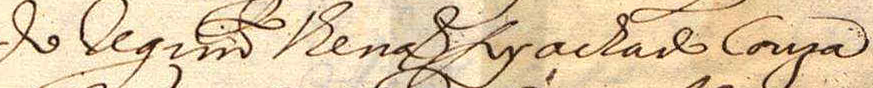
do Regimto lhe naõ foy achado Couza
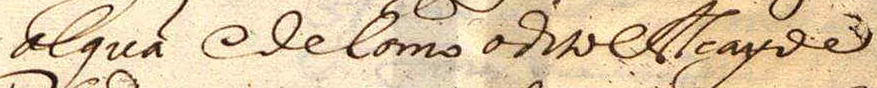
alguā e de Como o dito Alcayde
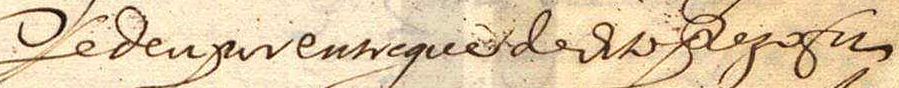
se deu por entregue do dito prezo fiz
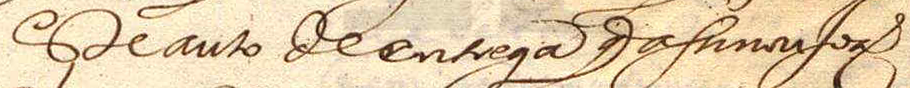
este auto de entrega q̄ assinou Joaõ
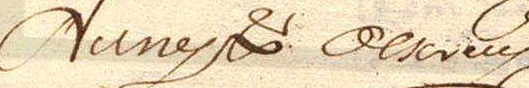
Nunes xer o escreuj
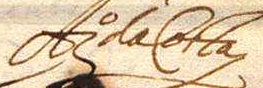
Ago da Costa
